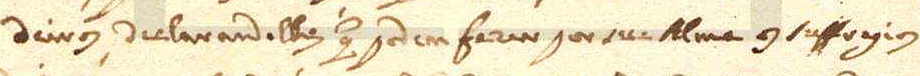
deiros, declarandolhes q̄ podem fazer por sua Alma os suffragios
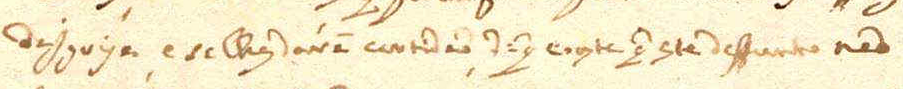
da Jgreya e se lhes dará certidaõ de q̄ conste q̄ este deffunto não
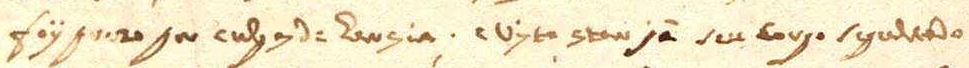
foy prezo por culpas de heresia; e visto estar já seu corpo sepultado
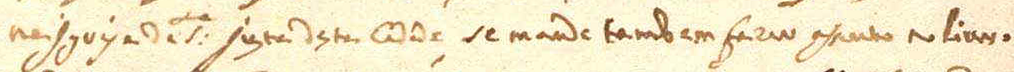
na Jgreja de s.ta justa desta Cidade se mande tambem fazer assento no liuro
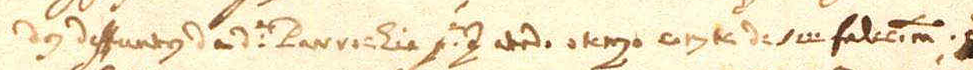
dos deffuntos da d:a Parrochia p.a q̄ a todo o tempo conste de seu falecimto; e q̄
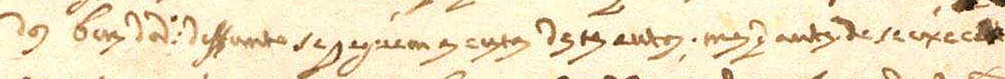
dos bens do d.o deffunto se paguem as custas destes autos; mas q̄ antes de se execut
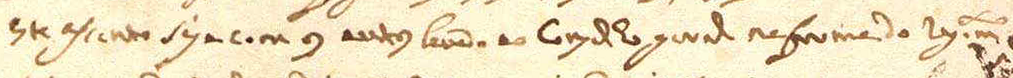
este assento seja com os autos leuado ao Conselho geral na forma do Regimto
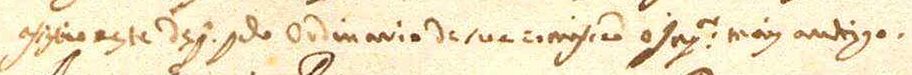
assistio a este despo. pelo ordinario de sua comissão o Jnq.or mais antigo.
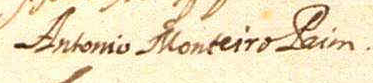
Antonio Monteiro Paim
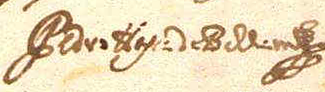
Pedro Hasse de Bellem
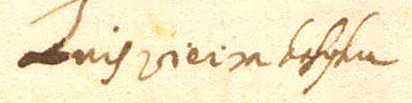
Luis vieira da Sylua
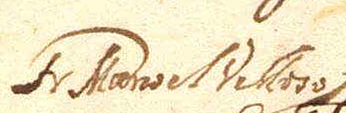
Fr Manoel Velloso
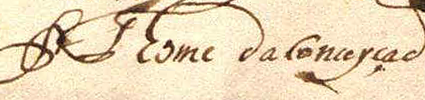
fr Thome da conceyçaõ
